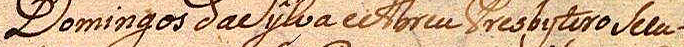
Domingos da Sylva e Abreu Presbytero Secu
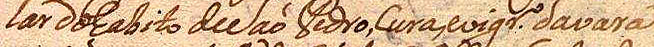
Lar do habito de Saõ Pedro, Cura, e vigr.o da vara
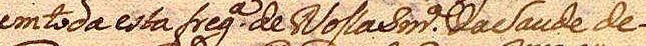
em toda esta freg.a de Nossa Snr.a da Saude de
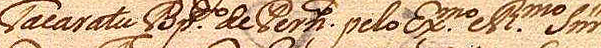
Tacaratu Bp.do de Pern.co pelo Ex.mo e R.mo Snr̄
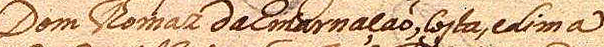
Dom Thomaz da Emcarnaçaõ, Costa, e Lima
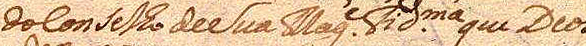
do Conselho de Sua Mag.e Fid.ma que Deos
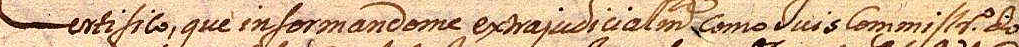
Certifico, que informandome extrajudicialmte como Iuis Commmissr.o do
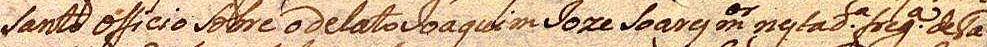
santo officio sobre o delato Ioaquim Ioze Soares mor nesta d.a freg.a de Ta
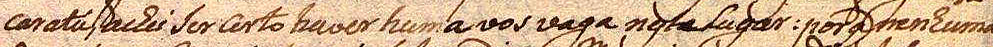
caratú, achei ser certo haver huma vos vaga nesta Lugar: porq̄ nenhuma
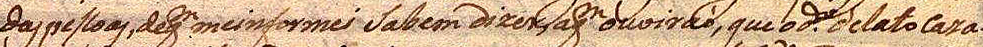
das pessoas, de qm me informei sabem dizer, a qm ouviraõ, que o d.o delato caza
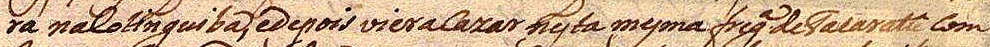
ra na Cotinguiba, e depois viera cazar nesta mesma freg.a de Tacaratú com
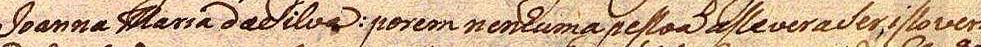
Ioanna Maria da Silva: porem nenhuma pessoa assevera ser, isso ver
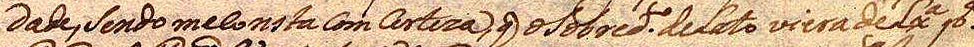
dade, sendo me consta com certeza q̄ o sobred.o deLato viera de Lxa p.a
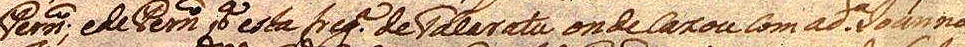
Pernco; e de Pernco pa esta freg.a de Tacaratu onde cazou com a d.a Ioanna
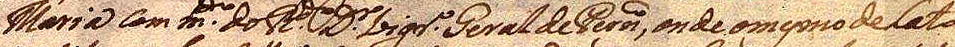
Maria com m.do do R.do D.r Vigr.o Geral de Pernco, onde o mesmo deLato,
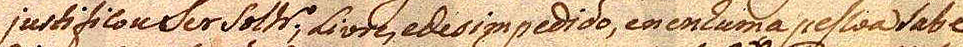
justificou Ser soltr.o; Livre, e desimpedido, e nenhuma pessoa sabe
